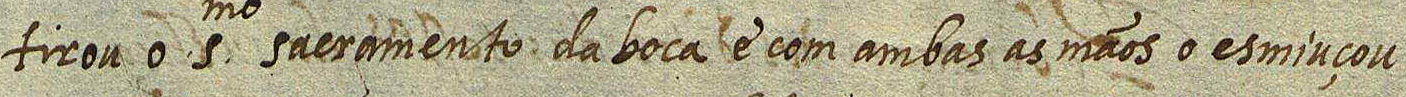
tirou o .s.mo sacramento da boca e com ambas as mãos o esmiuçou
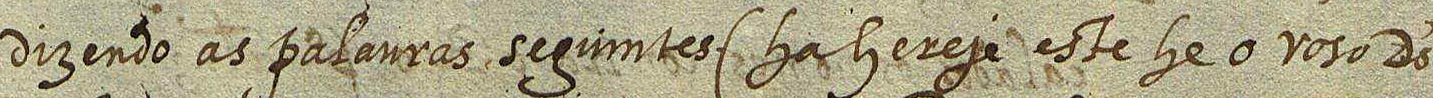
dizendo as palauras seguimtes (ha hereje este he o voso Ds̄
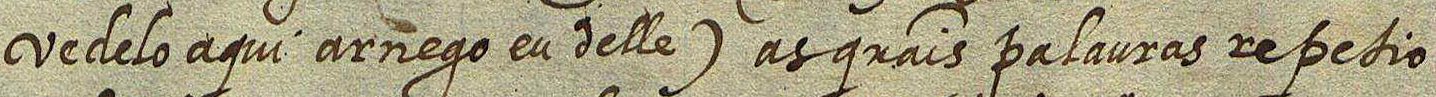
vedelo aqui arnego eu delle) as quaīs palauras repetio
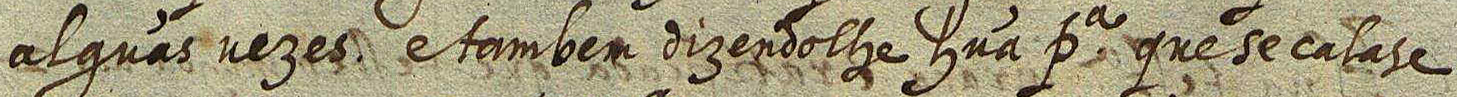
alguās uezes. e tambem dizendolhe huā pa. que se calase
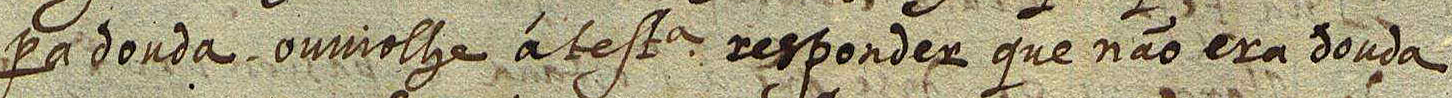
ꝑa douda ouuiolhe á testa. responder que não era douda
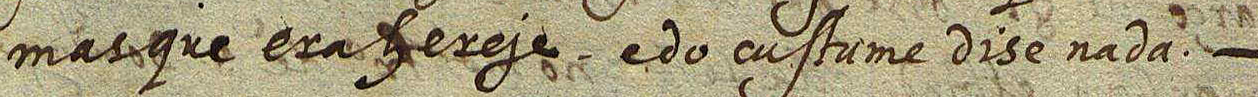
mas que era hereje. e do custume dise nada.
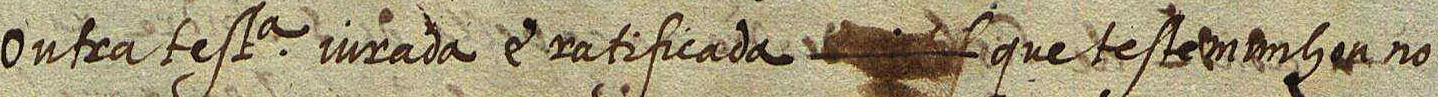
Outra testa. iurada e ratificada que testemunhou no
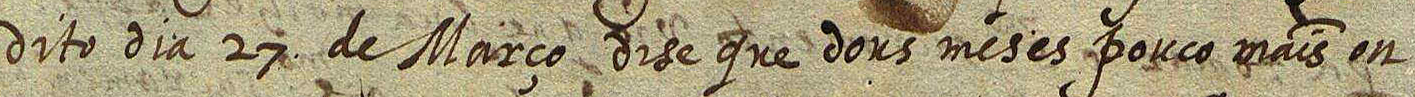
dito dia 27 de Março dise que dous meses pouco mais ou
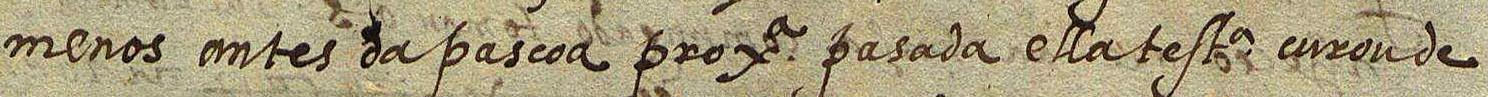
menos antes da pascoa prox.a pasada ella testa. curou de
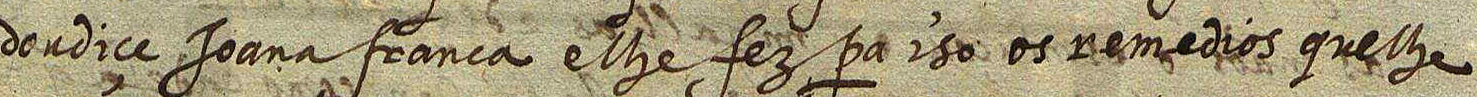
doudiçe Joana franca e lhe fez ꝑa iso os remedios que lhe
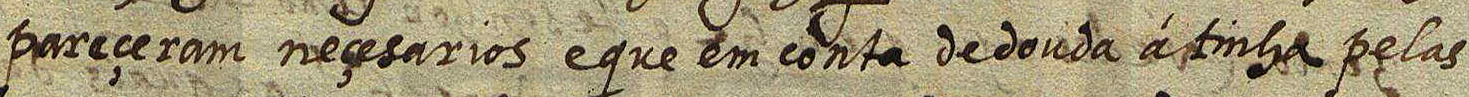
pareçeram neçesarios e que em conta de douda á tinha pelas
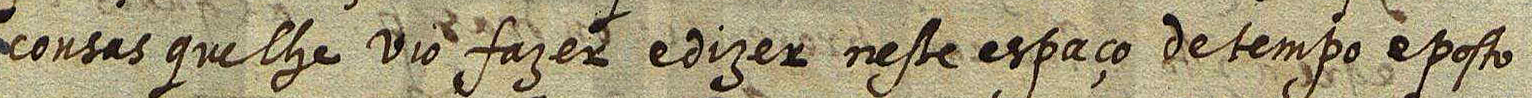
cousas que lhe vio fazer e dizer neste espaço de tempo e posto
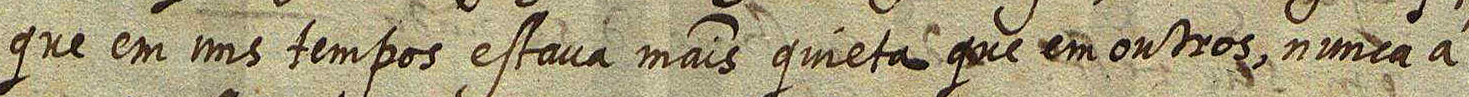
que em uns tempos estaua mais quieta que em outros, nunca á
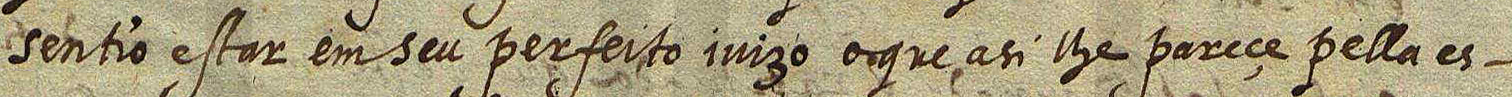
sentio estar em seu perfeito iuizo o que asi lhe pareçe pella es
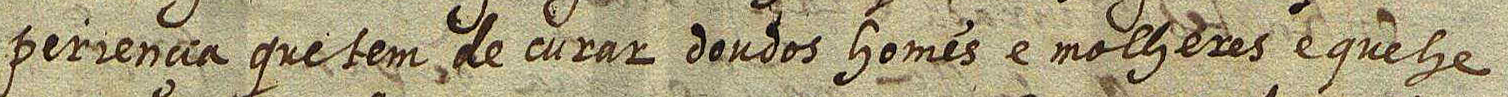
periençia que tem de curar doudos homēs e molheres e que he
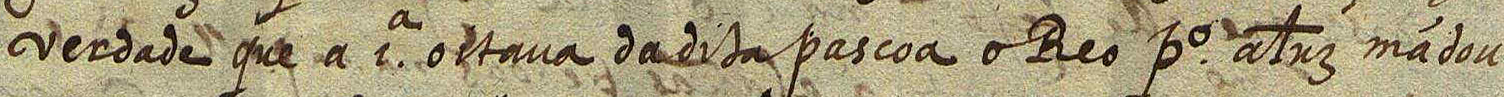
verdade que a 1.a oitaua da dita pascoa o Reo po. al̄uz mādou
